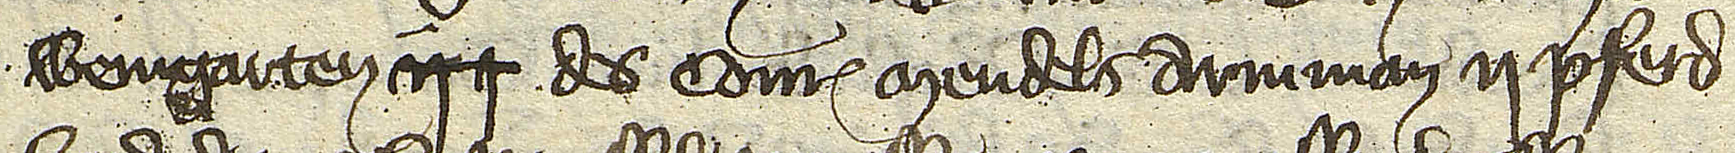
weingarten ii i des Conr* Mendels Armman ii pferd
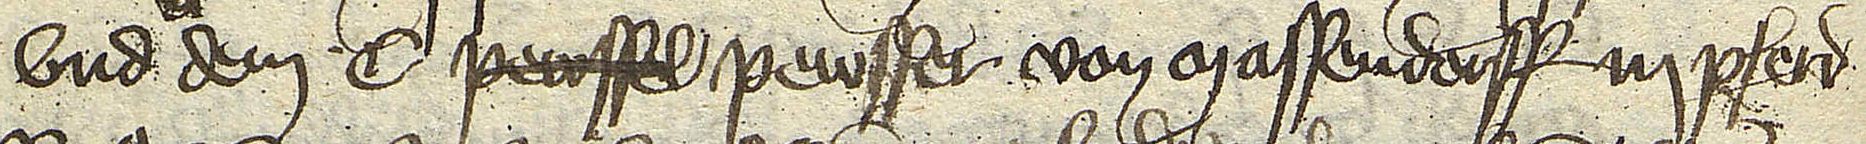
vnd dem . C pewſſel pewſſer von Maſſendorff iii pferd
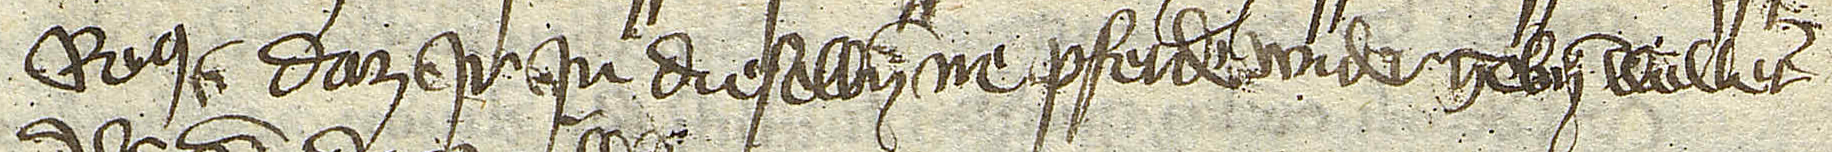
Ro* / daʒ Ir In dieſelbn* ire pferde wider gebn* wöllet
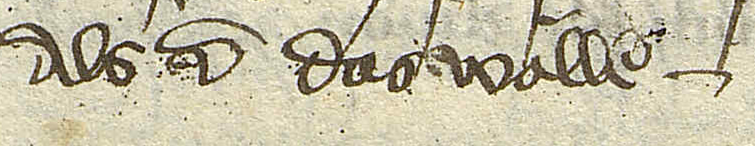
Als ec* das wölle* -
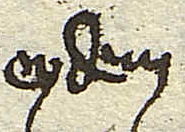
eyden
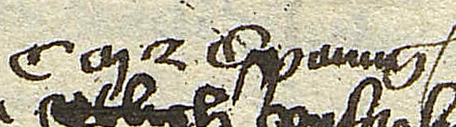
C M @ C paumg*
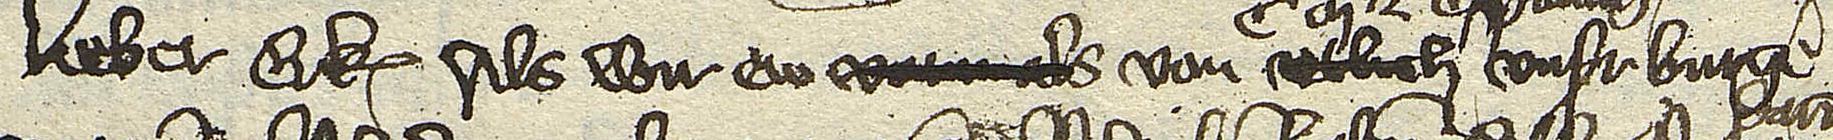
Lieber Erk* Als wir ew vormals von etlich vnſ*r burge*
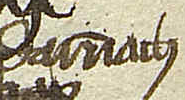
darnach
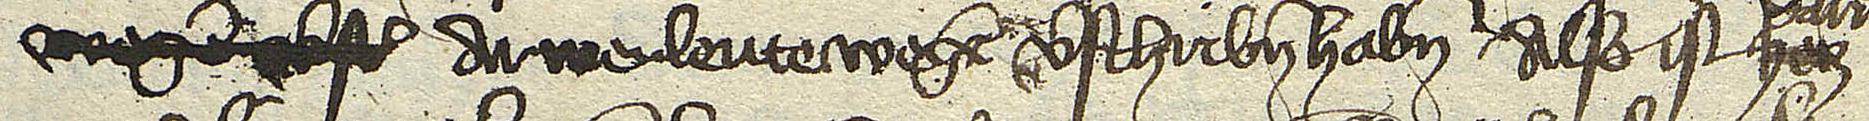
wege* v*ſch Armenleute wege* v*ſchribn* habn* / Alſo iſt yecʒ
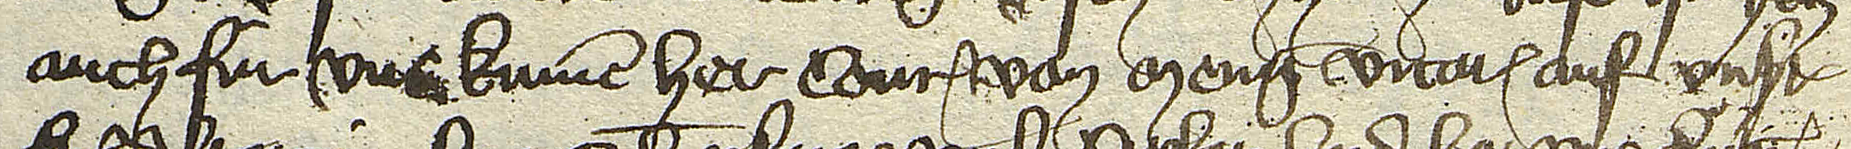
auch für vns kume* her Conr* von Meng* vicar* auf vnſ*r
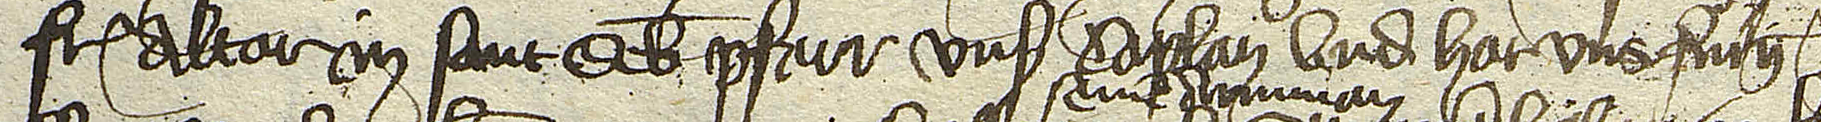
fr* Altar in ſant Seb* pfarr vnſ* Caplan vnd hat vns fürg*
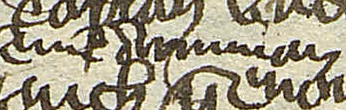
eine* Armman
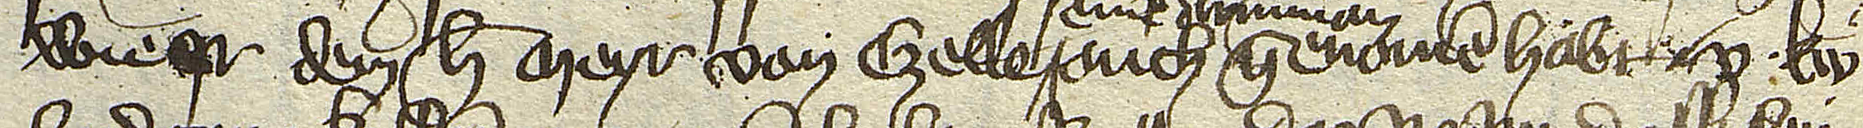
wie Ir dem h* Meyr von Cʒelle auch genome* habt v* kw
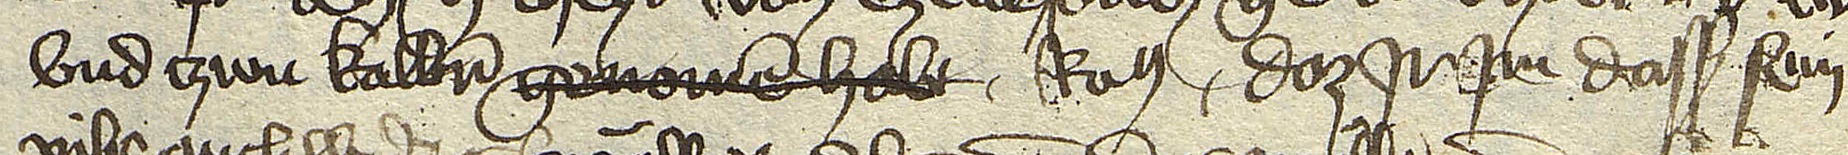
vnd cʒwu kalbn* genome* habt / Ro* / daʒ Ir Im daſſ* ſein
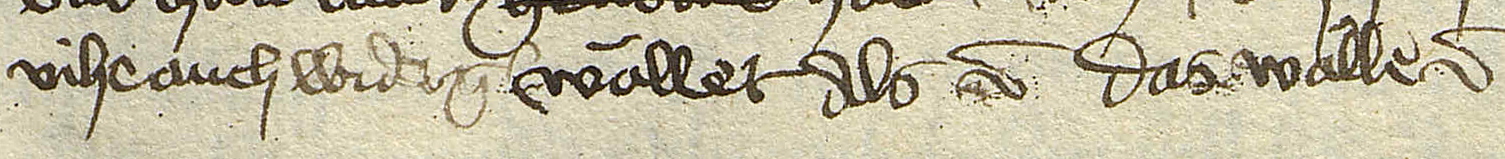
vihe auch widerg* wöllet Als ec* das wölle ec*
